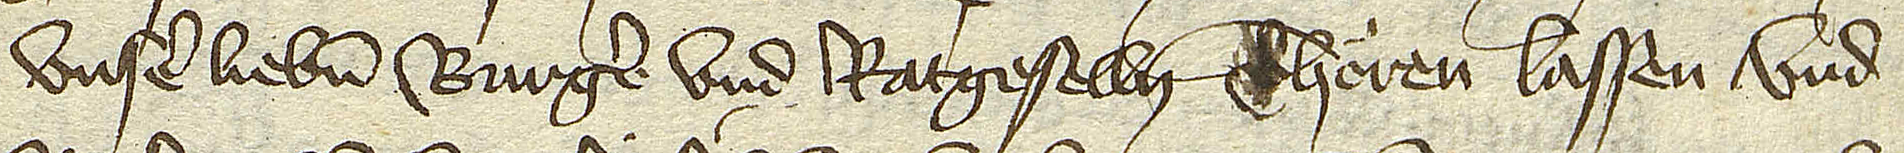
vnſe* liebn* Burge* vnd Ratgeſelln* v*hören laſſen / vnd
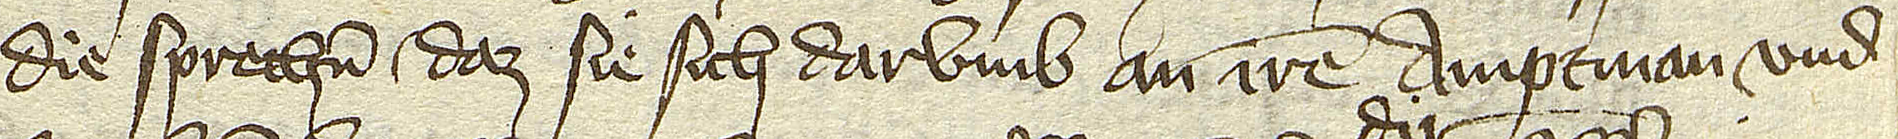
die ſprechn* / daʒ ſie ſich darvmb an ire* Amptman vnd
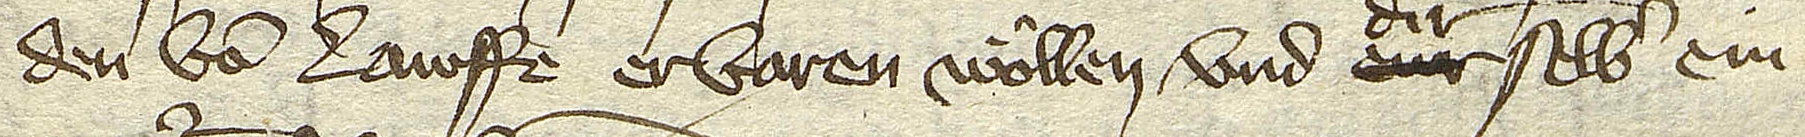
den vo* Lawffe ervaren wöllen / vnd ewr ſelb* ein
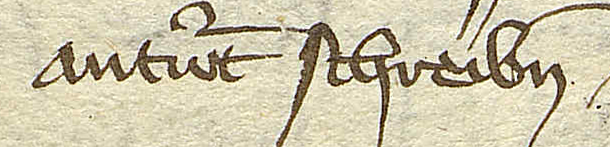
antwt* ſchreibn* /
